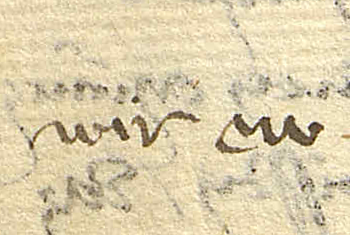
wir ew
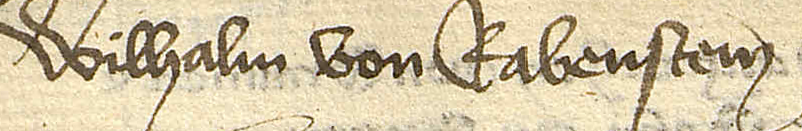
Wilhalm von Rabenſtein
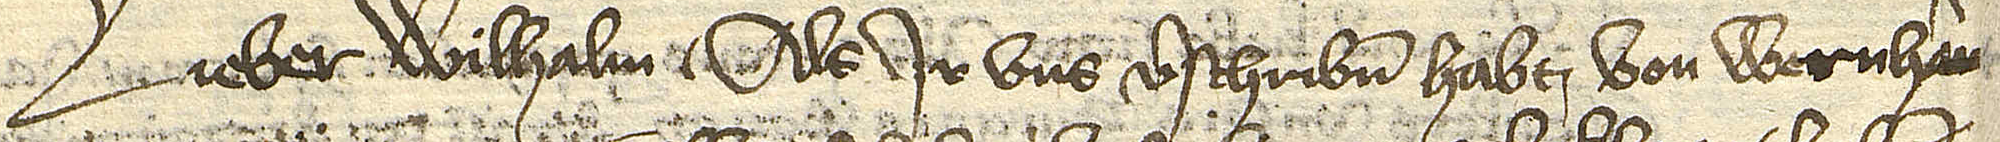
Lieber Wilhalm / Als Ir vns v*ſchribn* habt von Wernh*en
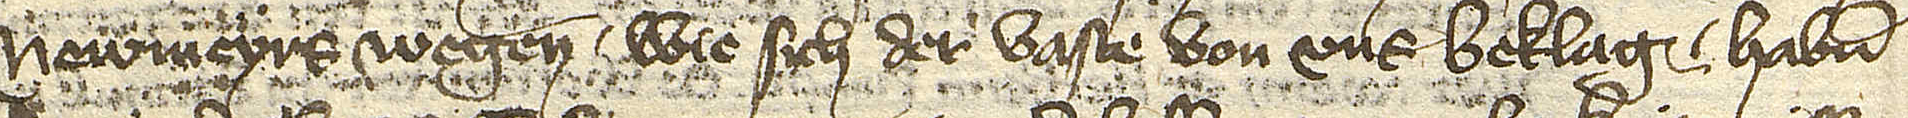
Newmeyrs wegen / wie ſich der vaſte von vns beklagt / habn*
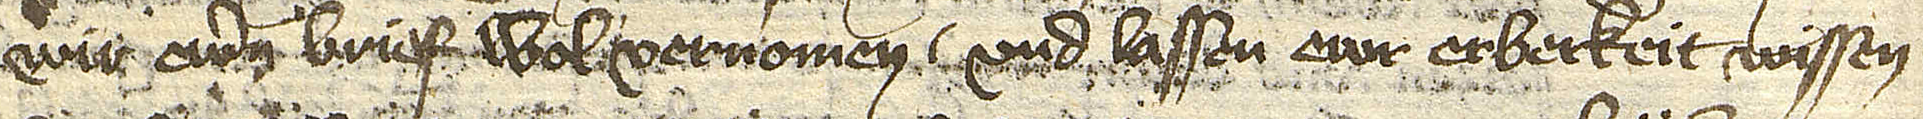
wir ew*n brief wol vernomen / vnd laſſen ewr erberkeit wiſſen
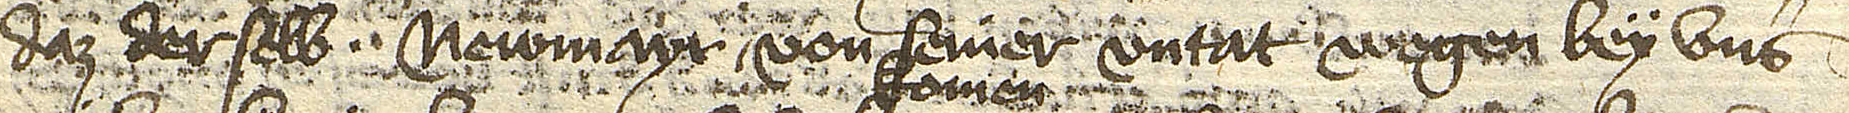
daʒ derſelb . Newmayr / von ſeiner vntat wegen bey vns
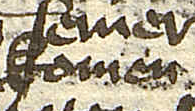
komen
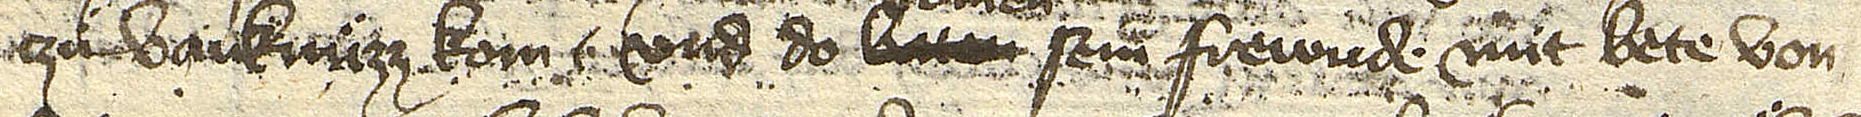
cʒü vanknüʒʒ kom / . vnd do baten ſein frewnde mit bete von
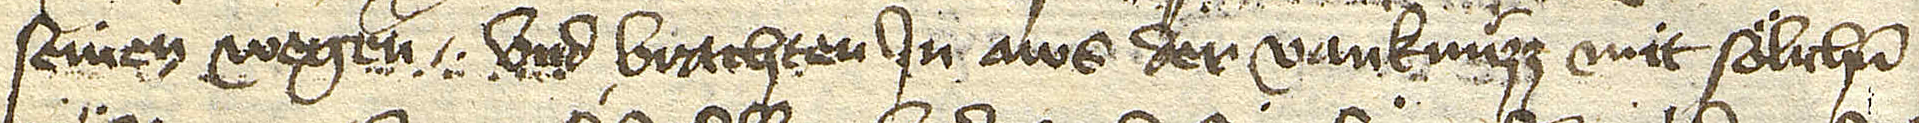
ſeinen wegen / . vnd brachten In aws vanknüʒʒ mit ſölichn*
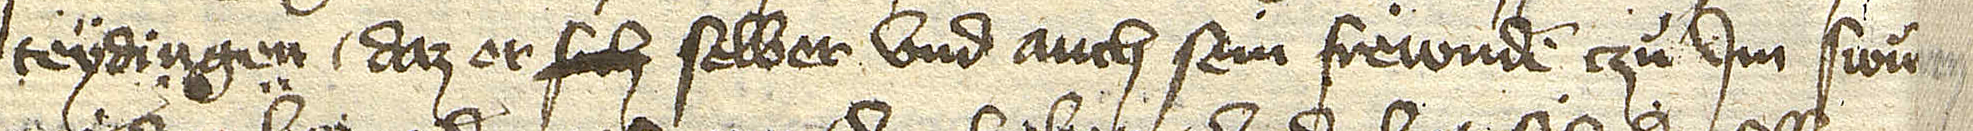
teydingen / daʒ er ſich ſelber vnd auch ſein frewnde cʒü Im ſwüren
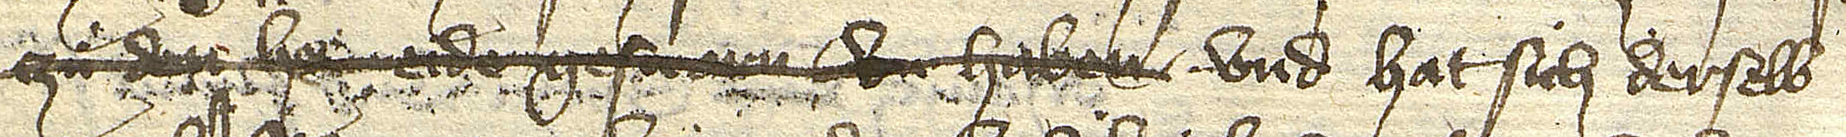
cʒü den hei eide geſworn / vn haben / . vnd hat ſich derſelb
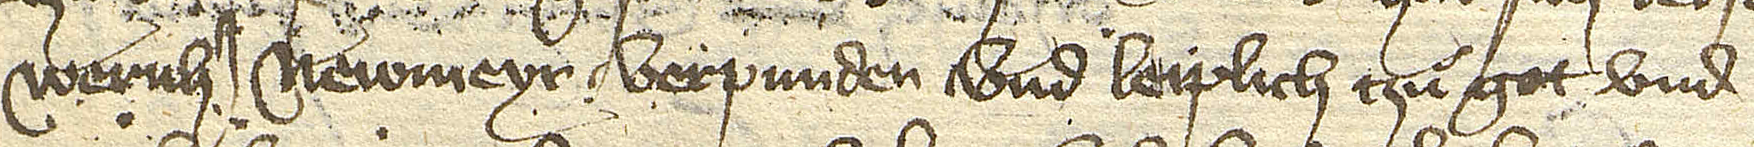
wernh* Newmeyr / verpunden / vnd leiplich cʒü got vnd
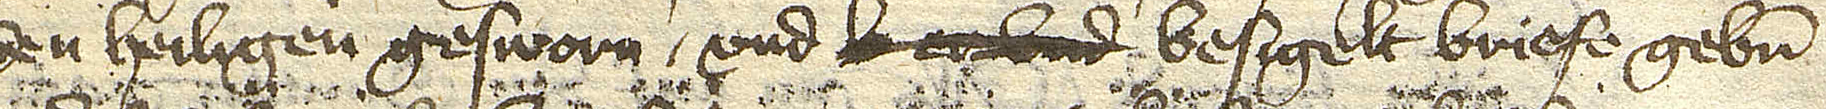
den heiligen geſworn / vnd l er vnd beſigelt briefe gebn*
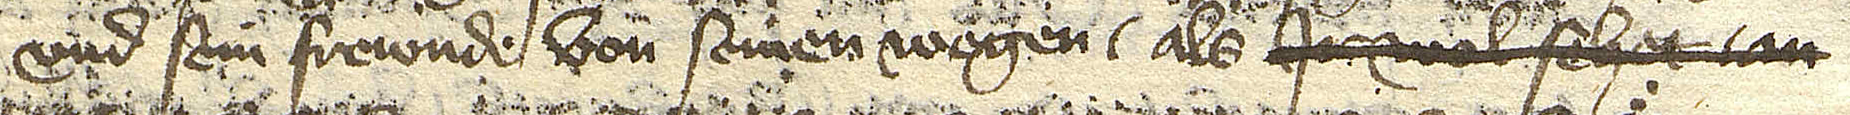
vnd ſein frewnde / von ſeinen wegen / als Ir wol ſehet / an
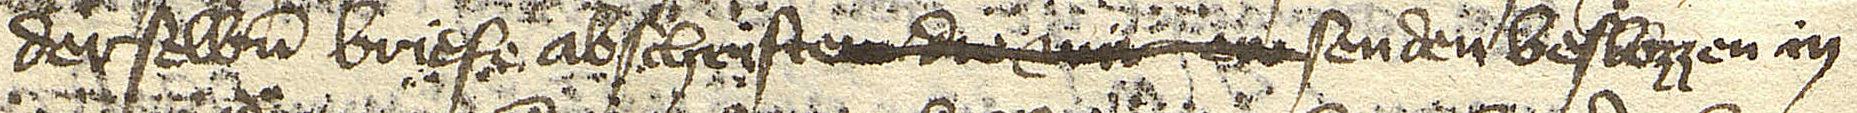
derſelbn* briefe abſchriften die wir ew ſenden beſloʒʒen in
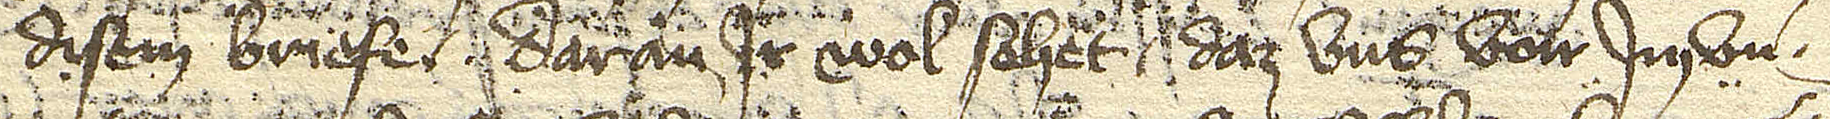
diſem briefe / . Daran Ir wol ſehet / daʒ vns von Im vn -
